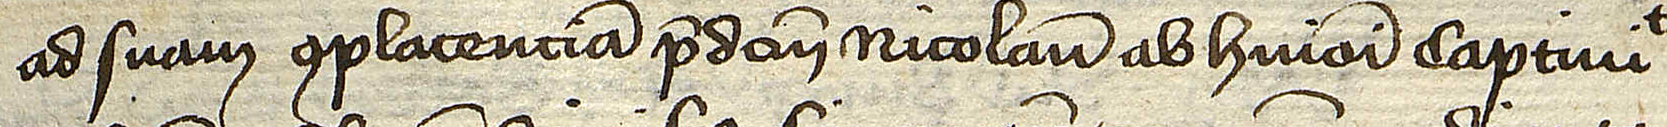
ad ſuam *placencia* p*d*c*m Nicolau* ab hui*o*i Captiui*
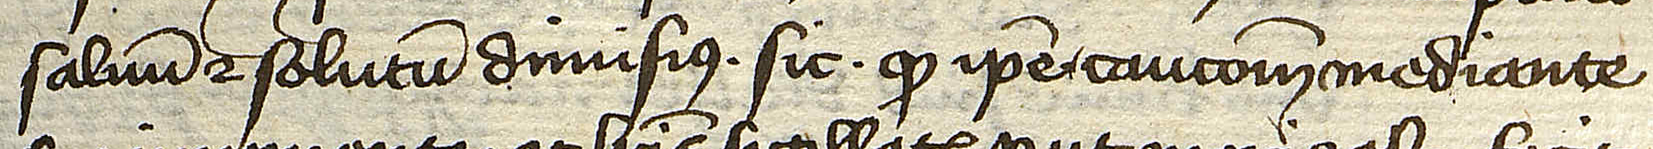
ſaluu* @ ſolutu* dimiſi* . ſic . q* ip*e cauc*o*m mediante
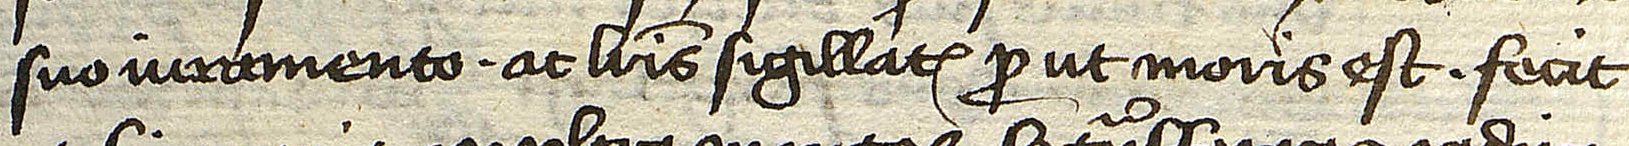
ſuo iuramento . ac l*ris ſigillat* p*ut moris eſt . fecit
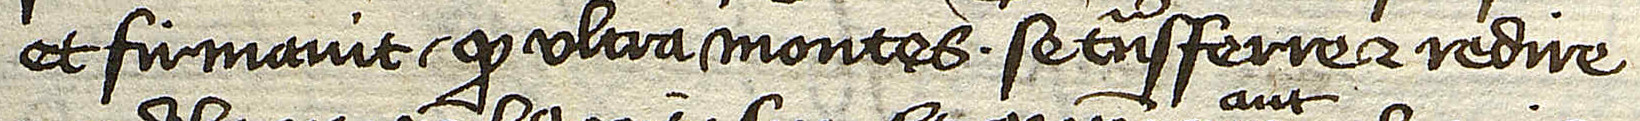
et firmauit / q* vltra montes . ſe t*nſferre @ redire
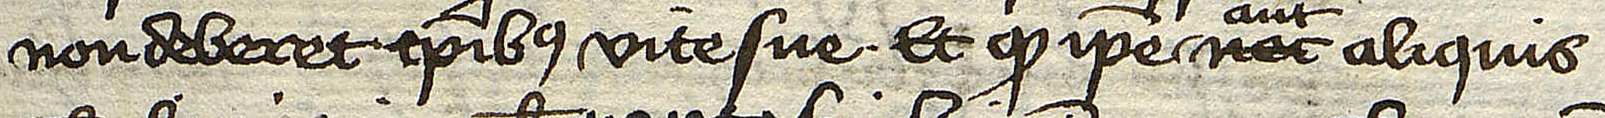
non deberet t*p*ib* vite ſue . Et q* ip*e / nec aliquis
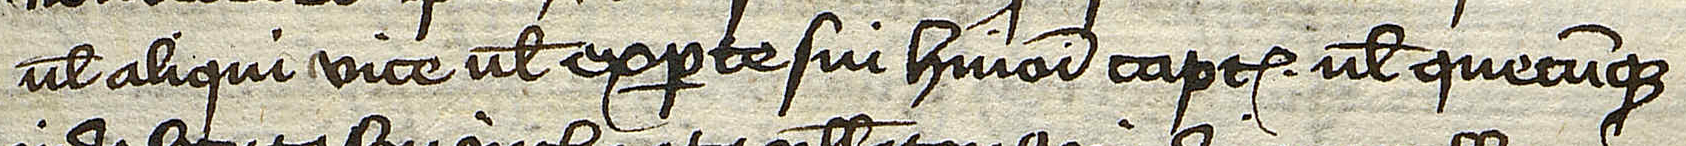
u*l aliqui vice u*l ex p*te ſui hui*o*i capt* u*l quecu*q*
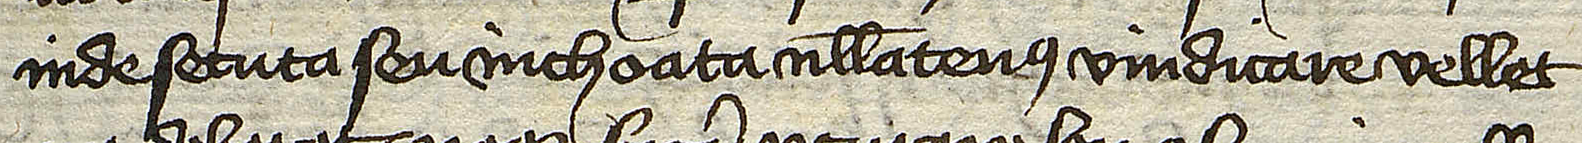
inde ſecuta ſeu inchoata n*llaten* vindicare vellet
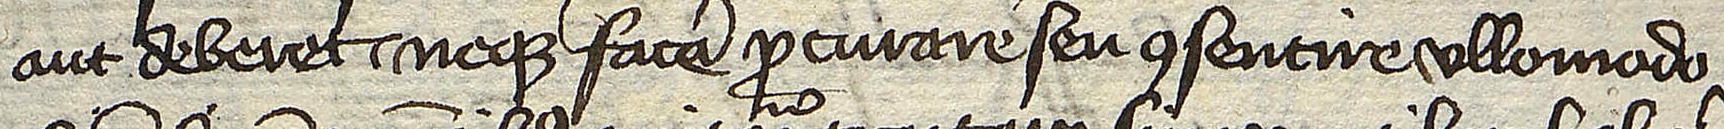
aut deberet / neq* face* p*curare ſeu *ſentire vllomodo
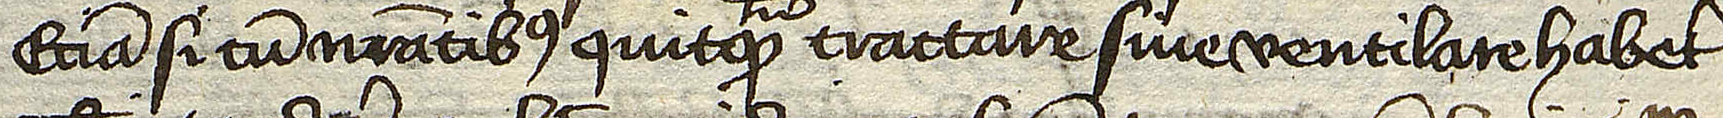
Ecia* ſi cu* n*ratib* quitq*m tractare ſiue ventilare habe*t
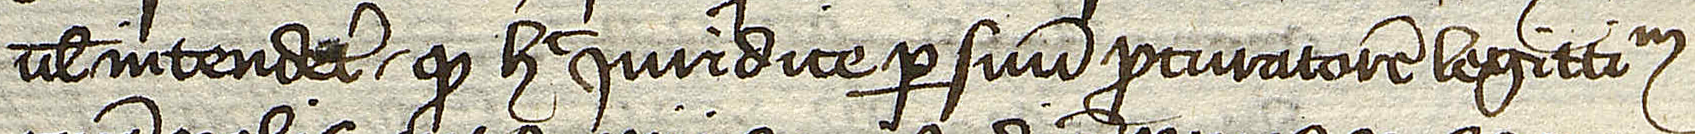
u*l intende*t / q* h*c Iuridice p* ſu*m p*curatore* legitti*
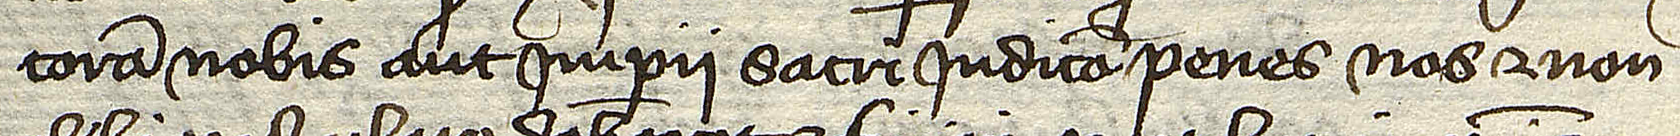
cora* nobis aut Imp*ii Sacri Iudic*o penes nos @ non
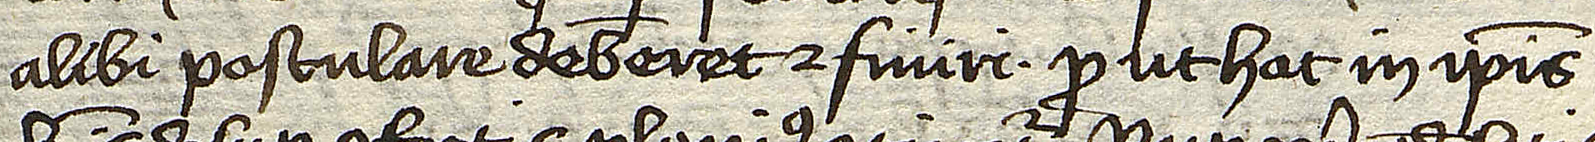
alibi poſtulare deberet @ finiri . p*ut hoc in ip*is
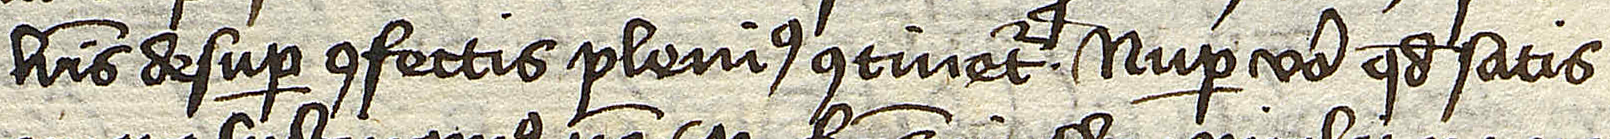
l*ris deſup* *fectis pleni* *tinet* . Nup* v*o q*d ſatis
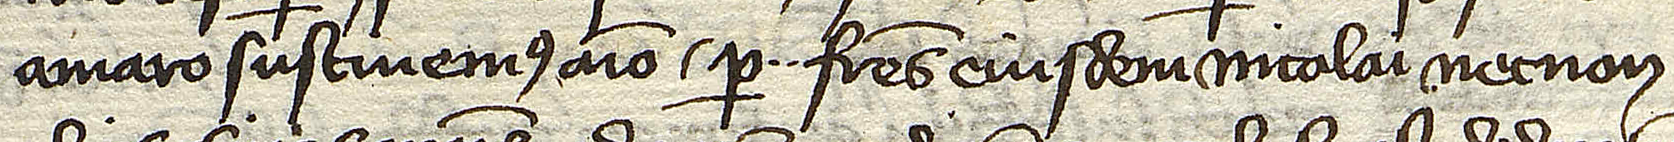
amaro ſuſtinem* a*i*o / p* . . f*res eiuſdem Nicolai nec non
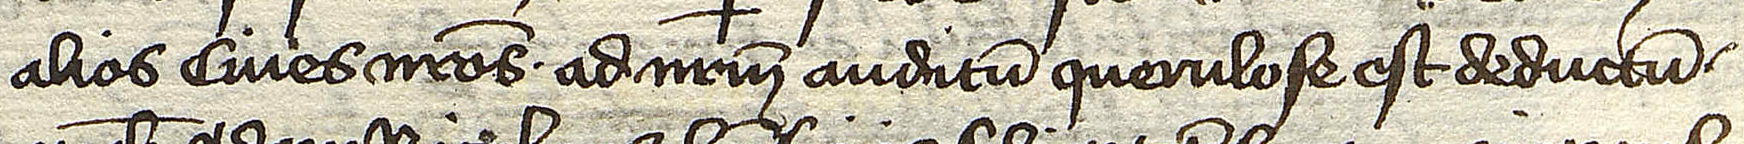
alios Ciues n*ros . ad n*r*m auditu* queruloſe eſt deductu* /
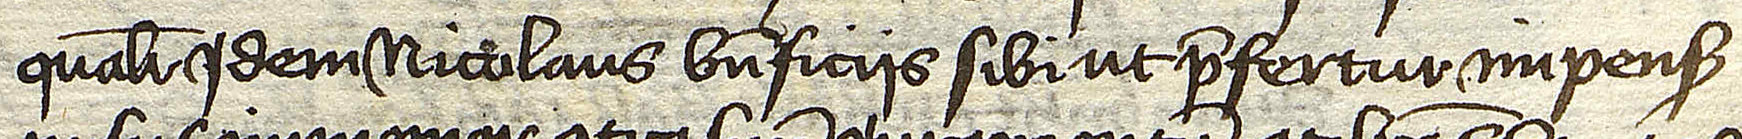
quali* Idem Nicolaus b*n*ficiis ſibi ut p*fectur impenſ*
